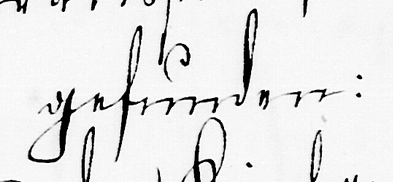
gefunden:
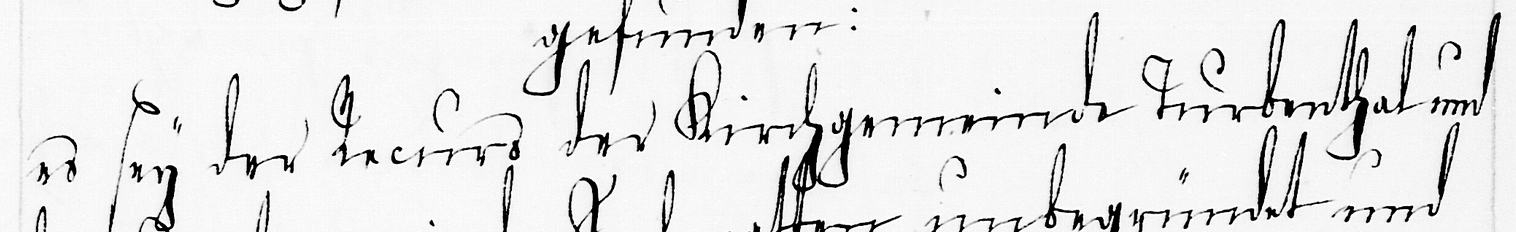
es sey der Recurs der Kirchgemeinde Turbenthal und
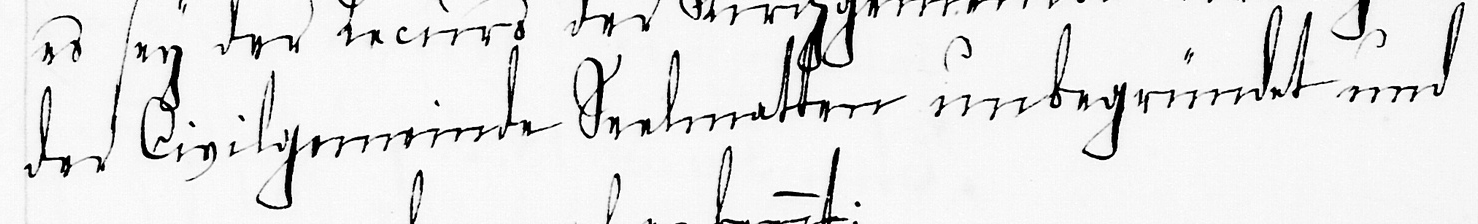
der Civilgemeinde Seelmatten unbegründet und
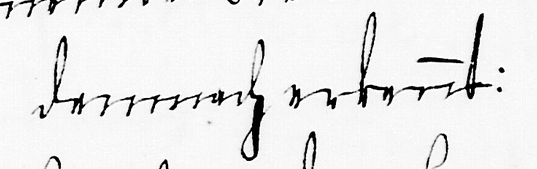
demnach erkennt:
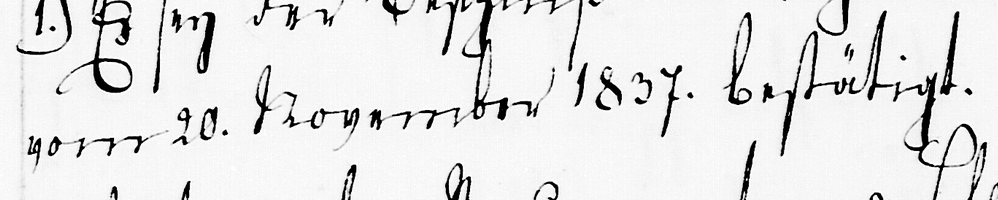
vom 20. November 1837. bestätigt.
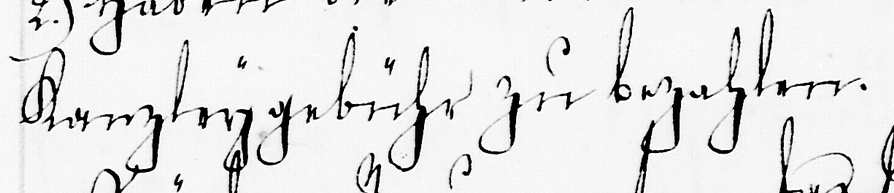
Kanzleygebühr zu bezahlen.
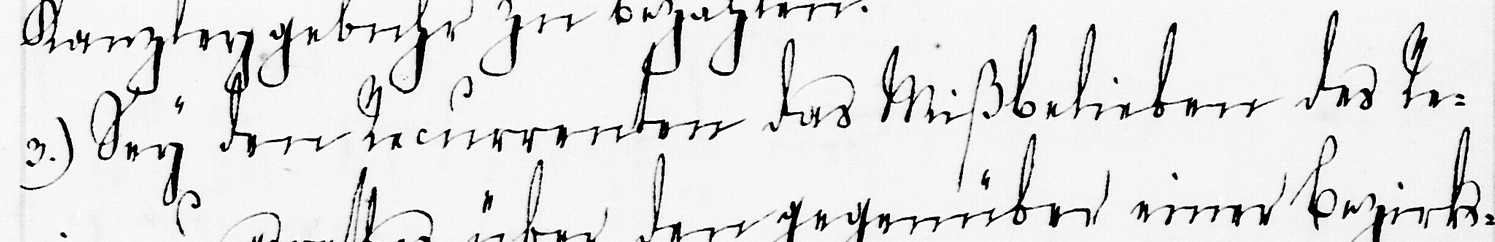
3.) Sey den Recurrenten das Mißbelieben des Re¬
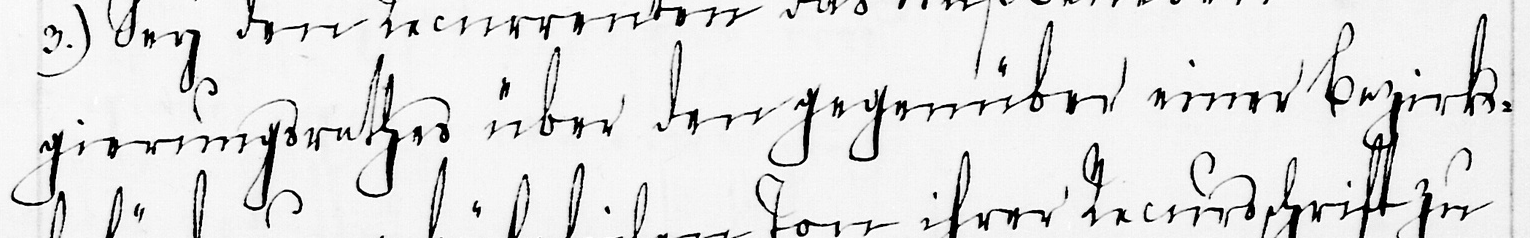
gierungsrathes über den gegenüber einer Bezirks¬
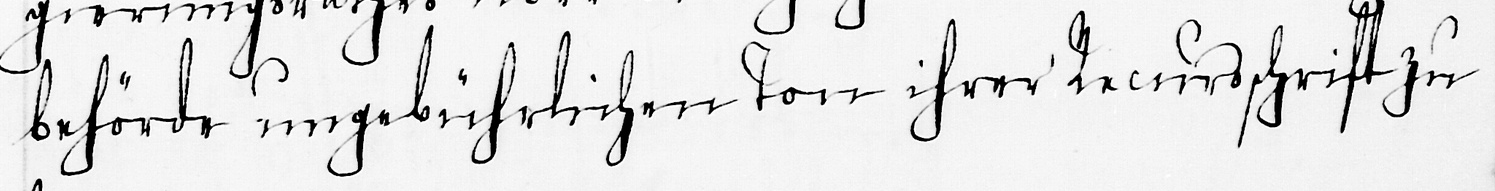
behörde ungebührlichen Ton ihrer Recursschrift zu
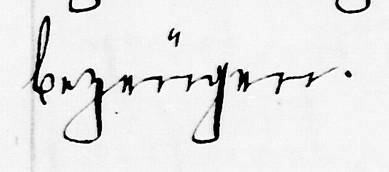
bezeugen.
